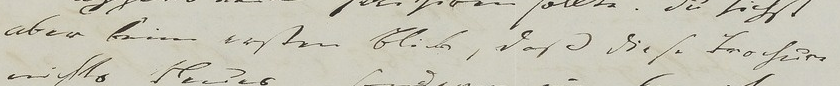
aber beim ersten Blick, daß diese Brochure
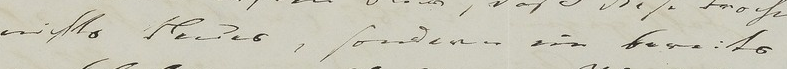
nichts Neues, sondern ein bereits
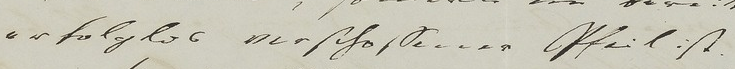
erfolglos verschossener Pfeil ist.
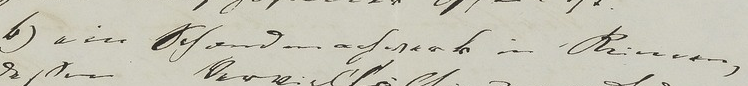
b) ein Schandmachwerk in Reimen,
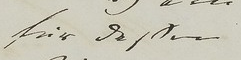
für dessen
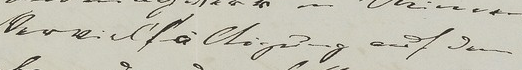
Vervielfältigung auf dem
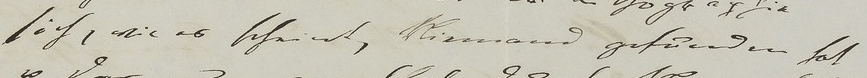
sich, wie es scheint, Niemand gefunden hat
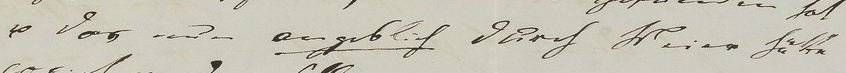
& das nun angeblich durch Meier hätte
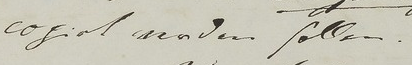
copirt werden sollen.
